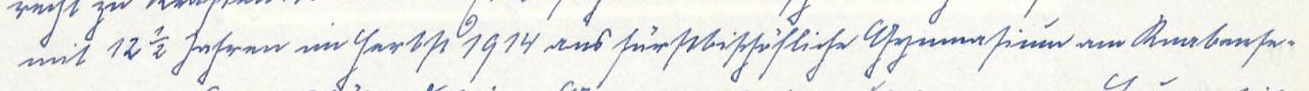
mit 12 1/2 Jahren im Herbst 1914 ans fürstbischöfliche Gymnasium am Knabense-
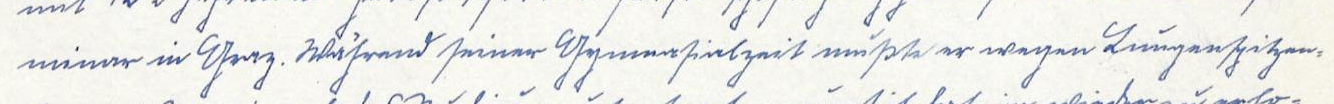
minar in Graz. Während seine Gymnasialzeit mußte er wegen jungen Lungenspitzen-
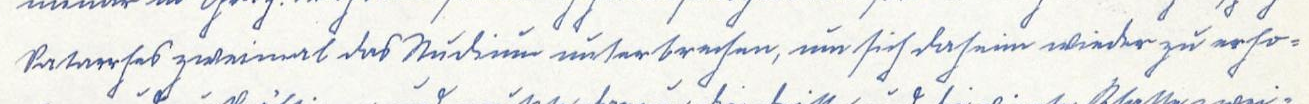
katarrhes zweimal das Studium unterbrechen, um sich daheim wieder zu erho-
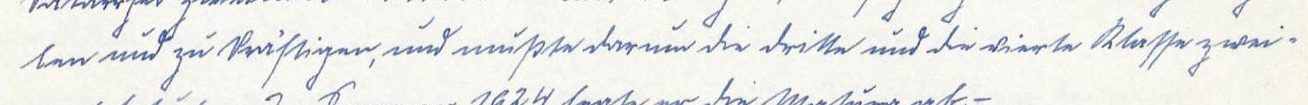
len und zu kräftigen, und mußte der dritte und vierte Klasse zwei-
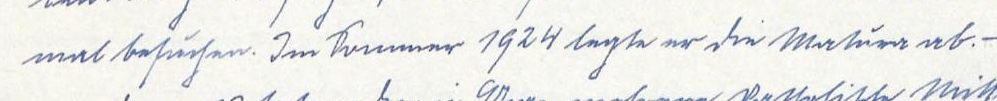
mal besuchen. Im Sommer 1924 legte er die Matura ab.
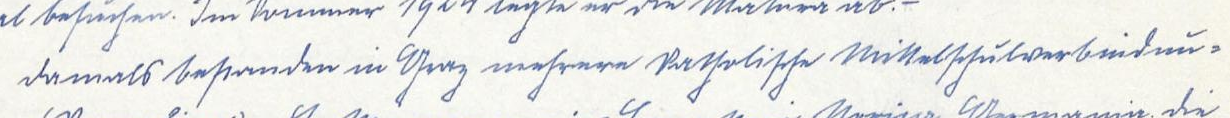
Damals bestanden in Graz mehrere katholische Mittelschulverbindun-
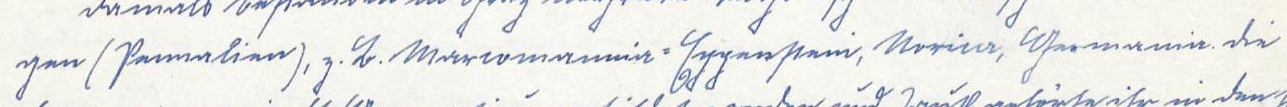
gen (Pennalien), z. B. Marcomannia-Eppenstein, Norica, Germania. Die
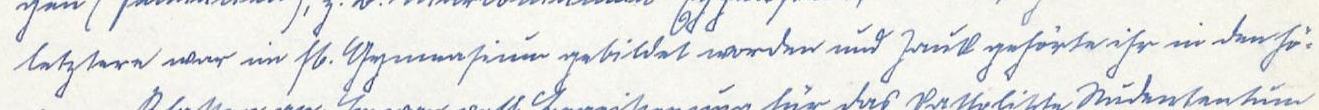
letztere war am fb. Gymnasien gebildet worden und Jauk gehörte ihr in den hö-
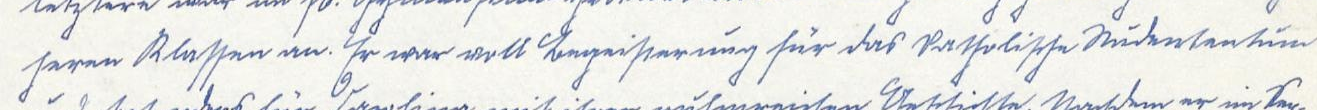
heren Klassen an. Er war voll Begeisterung für das katholische Studententum
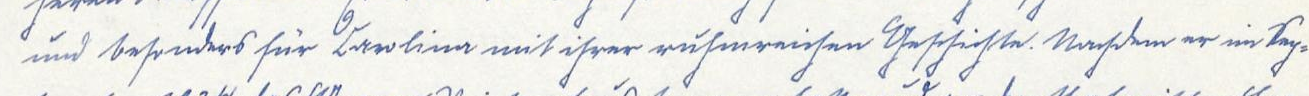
und besonders für Carolina mit ihrer ruhmreichen Geschichte. Nachdem er im Sep-
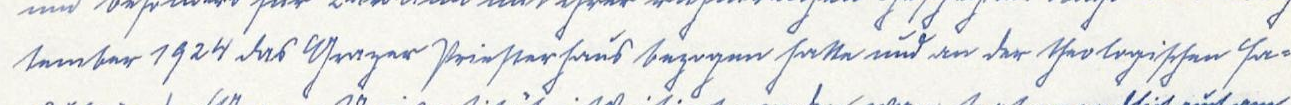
tember 1924 das Grazer Priesterhaus bezogen hatte und an der theologischen Fa-
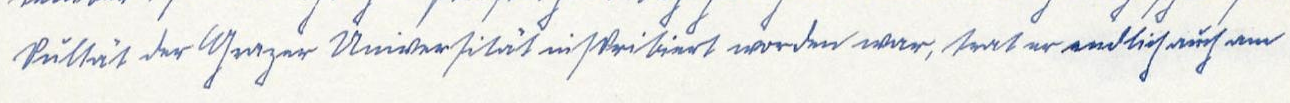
kultät der Grazer Universität inskribiert worden war, trat er endlich auch am
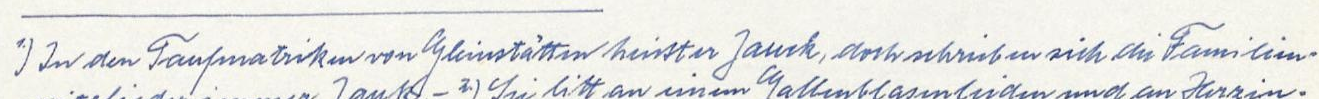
1) In den Taufmatriken von Gleinstätten heißt er Jauk, doch schrieben sich die Famlien-
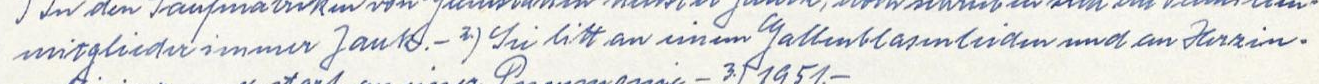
mitglieder immer Jauck. 2) Sie litt an einem Gallenblasenleiden und an Herzin-
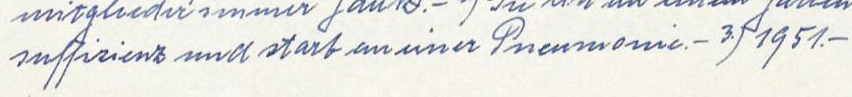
suffizienz und starb an einer Pneumonie.- 3) 1951.
